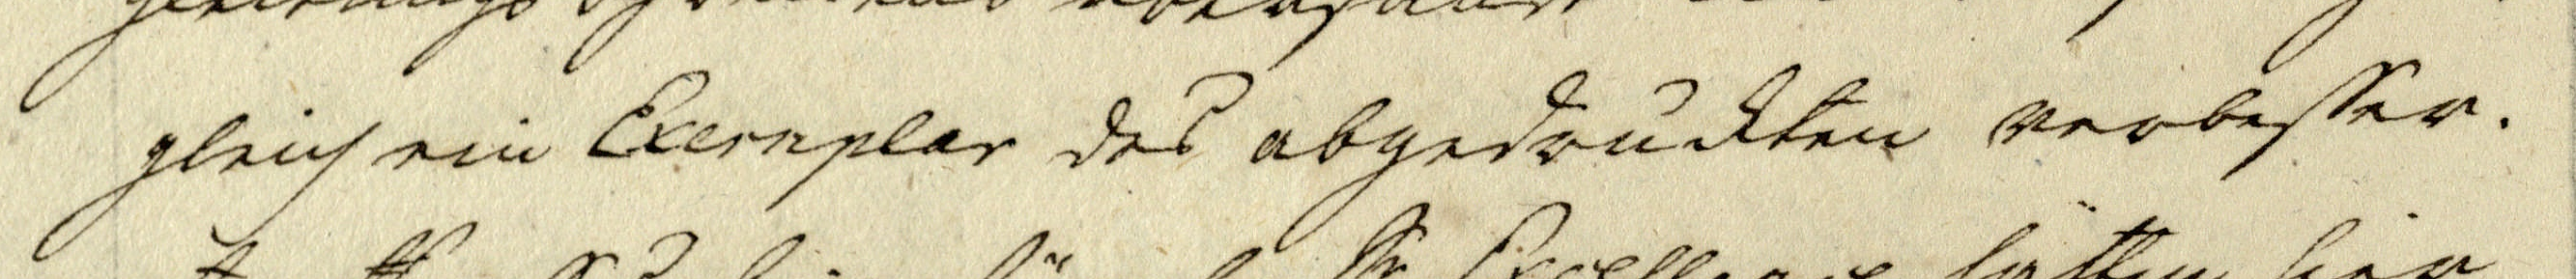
gleich ein Exemplar des abgedruckten verbesser¬
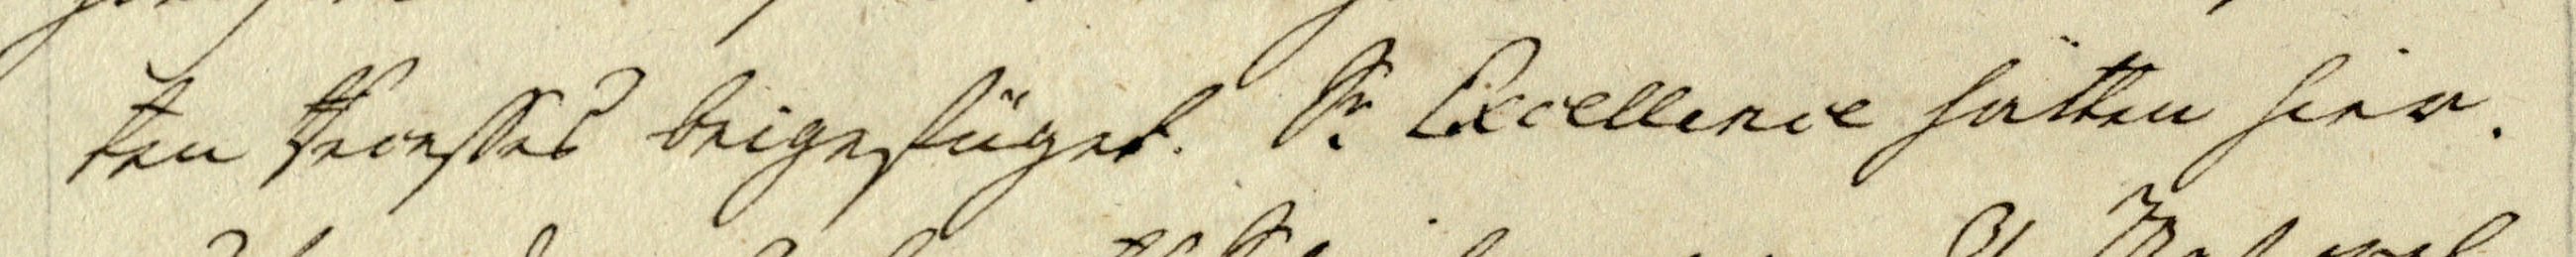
ten Recesses beigefüget. Sr Excellence hätten hier¬
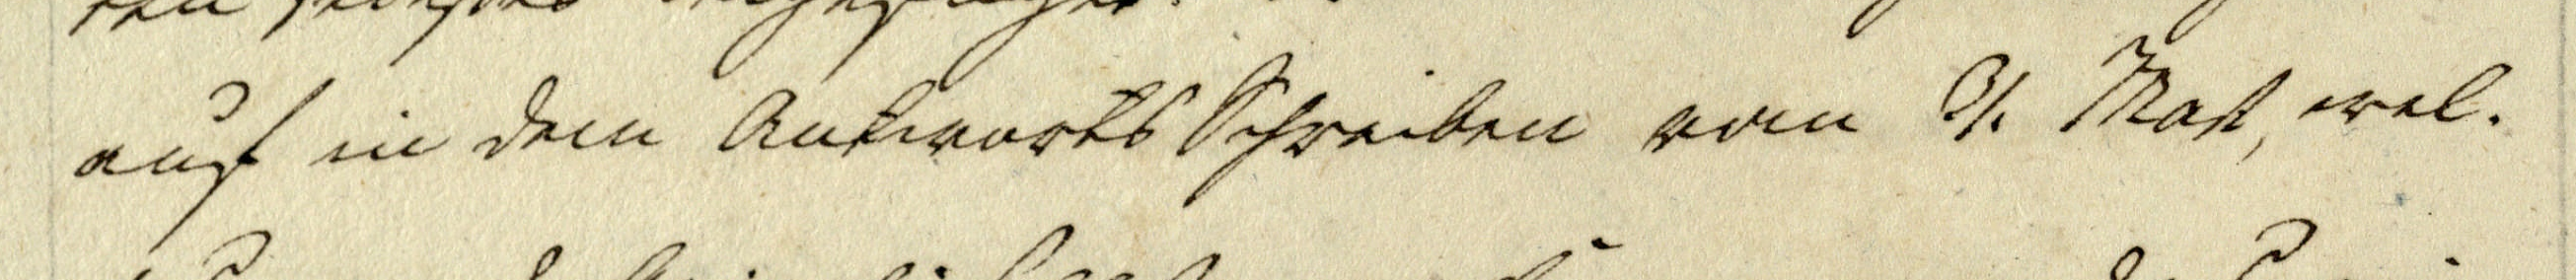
auf in dem Antworts Schreiben vom 31. Mart, wel¬
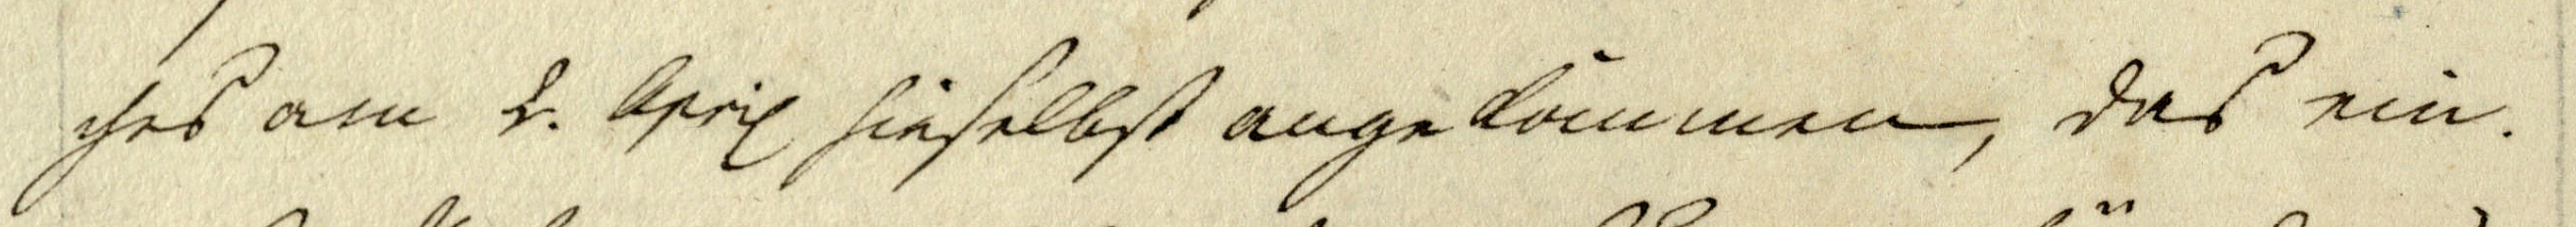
ches am 2. April hieselbst angekommen, das ein¬
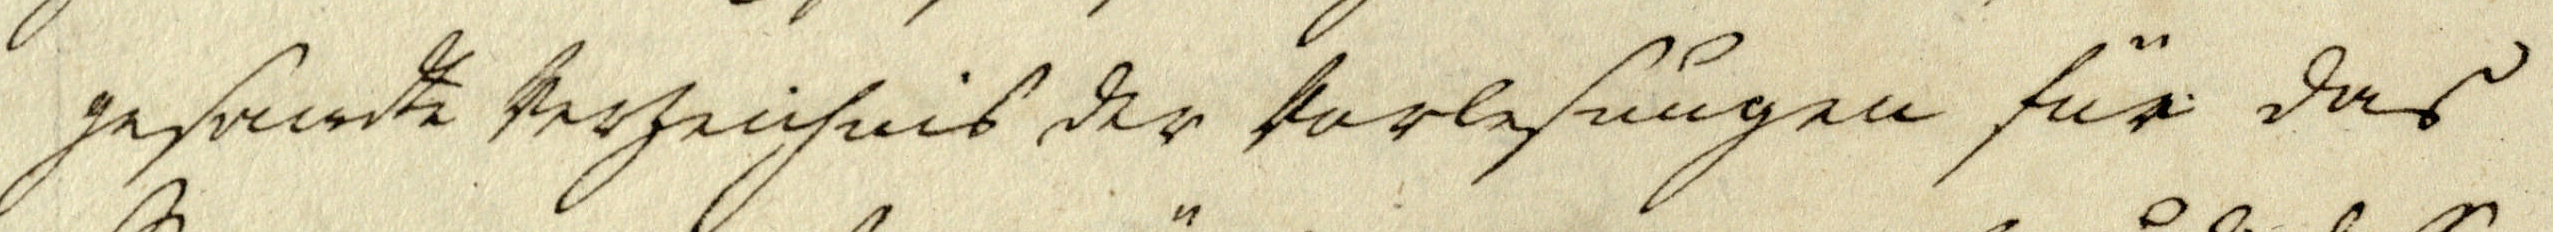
gesandte Verzeichnis der Vorlesungen für das
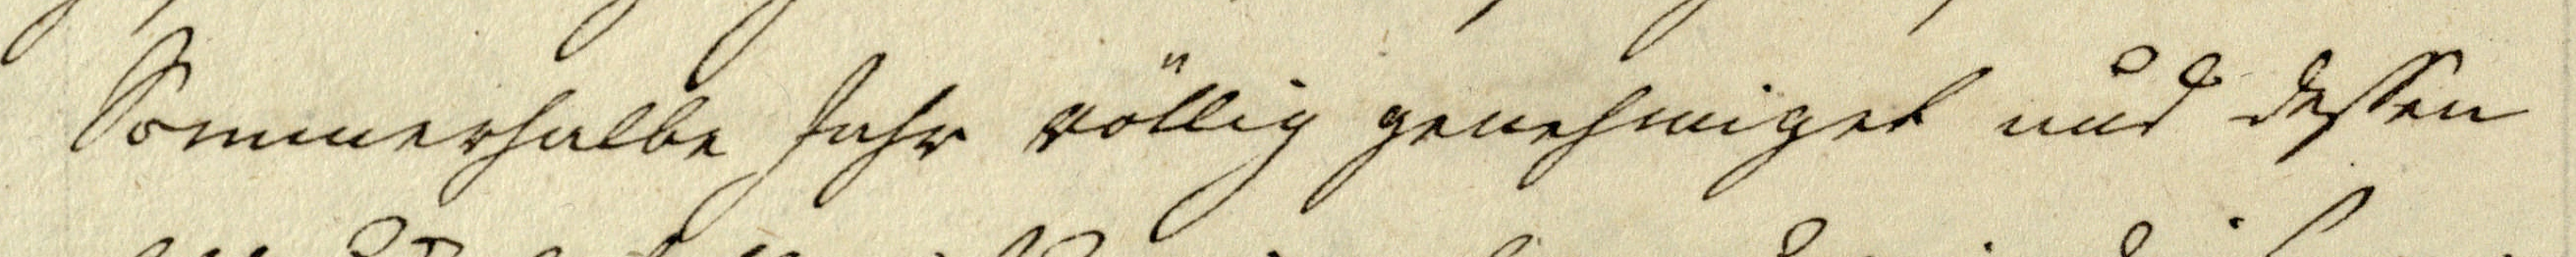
Sommerhalbe Jahr völlig genehmiget und dessen
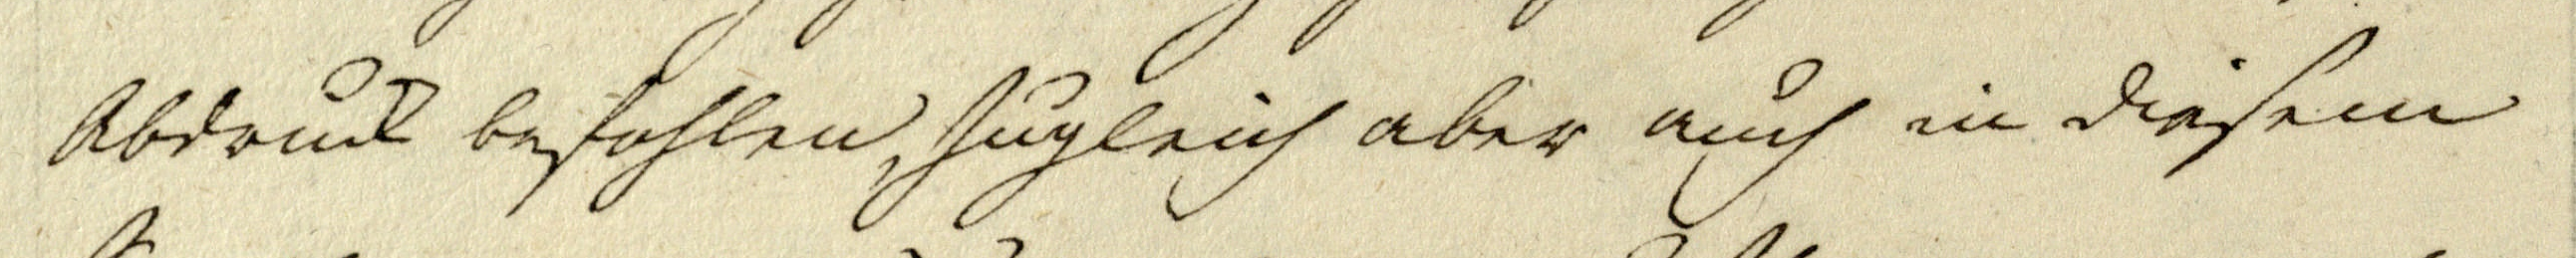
Abdruck befohlen, zugleich aber auch in diesem
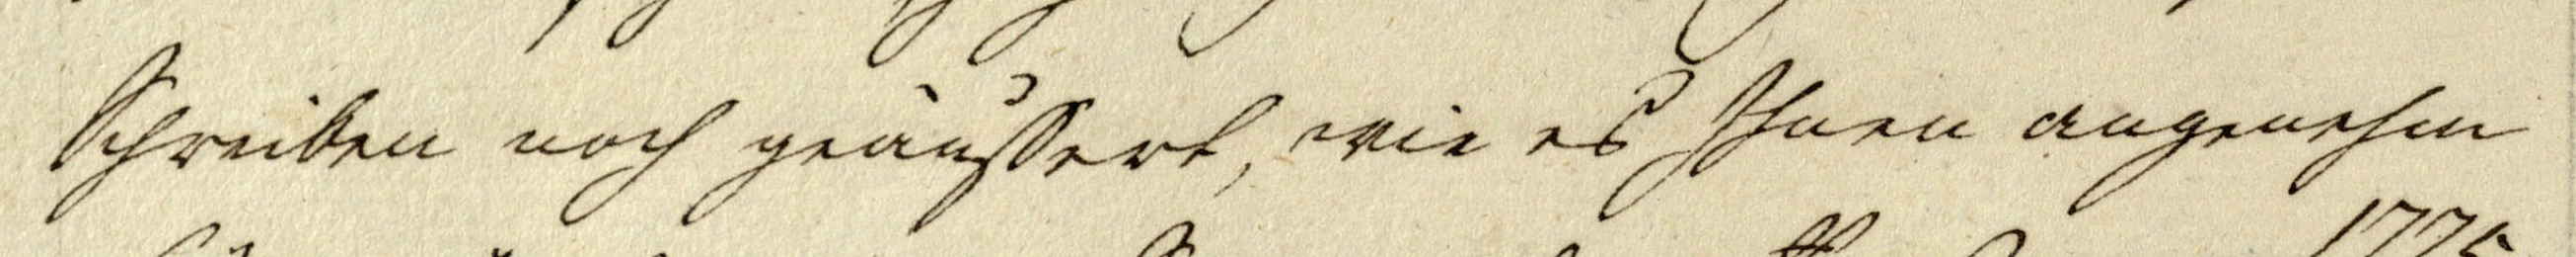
Schreiben noch geäussert, wie es Ihnen angenehm
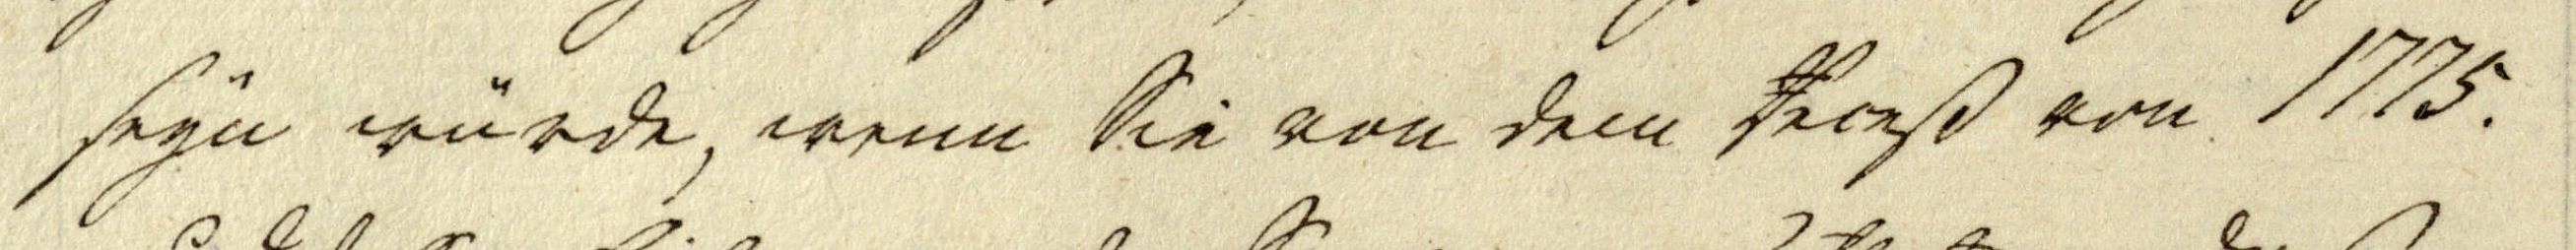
seÿn würde, wenn Sie von dem Receß von 1775.
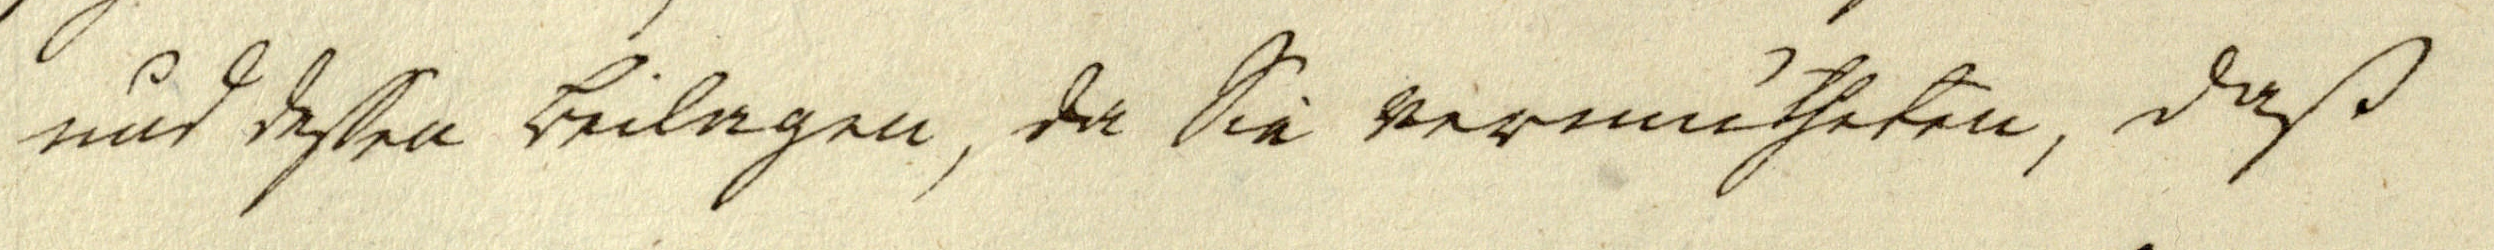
und dessen Beilagen, da Sie vermutheten, daß
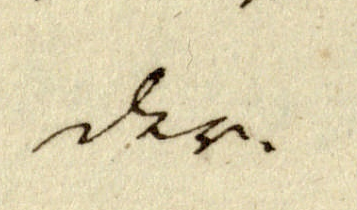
der¬
